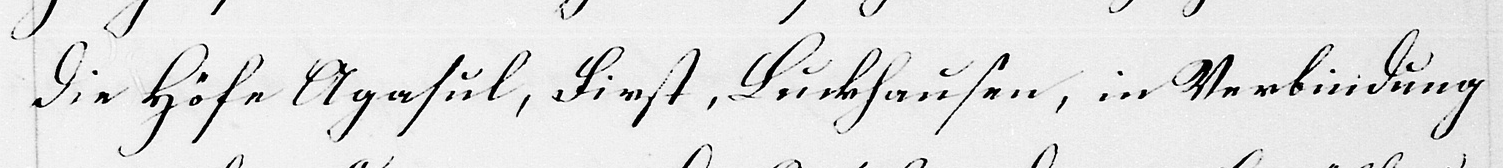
die Höfe Agasul, First, Luckhausen, in Verbindung
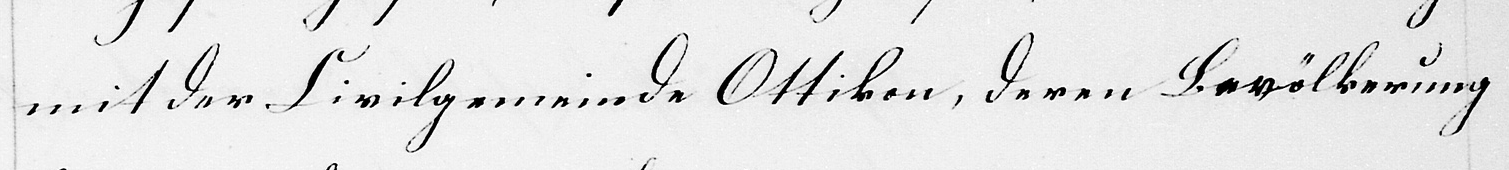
mit der Civilgemeinde Ottikon, deren Bevölkerung
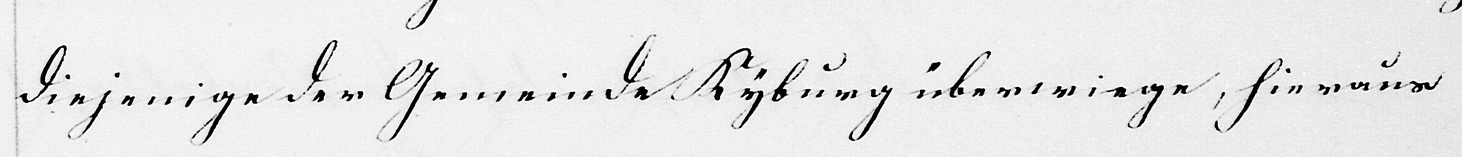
diejenige der Gemeinde Kyburg überwiege, hieraus
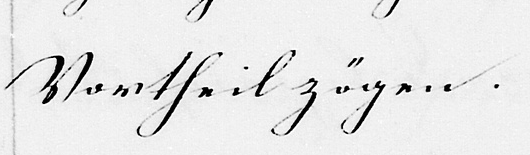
Vortheil zögen.
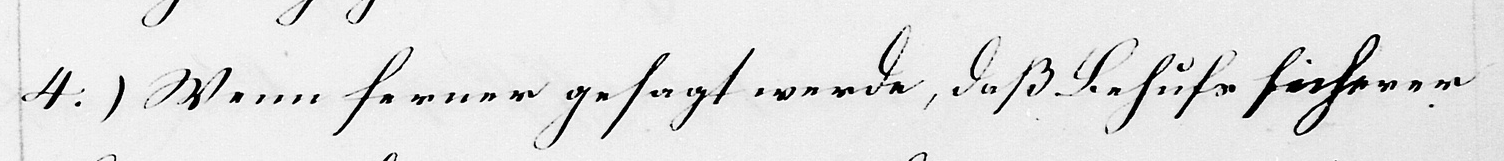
4.) Wenn ferner gesagt werde, daß Behufs sicherer
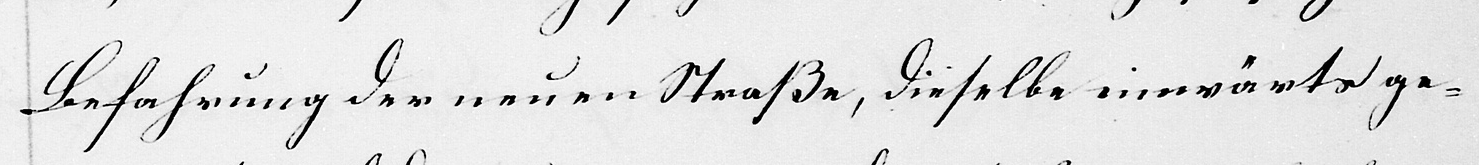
Befahrung der neuen Straße, dieselbe einwärts ge¬
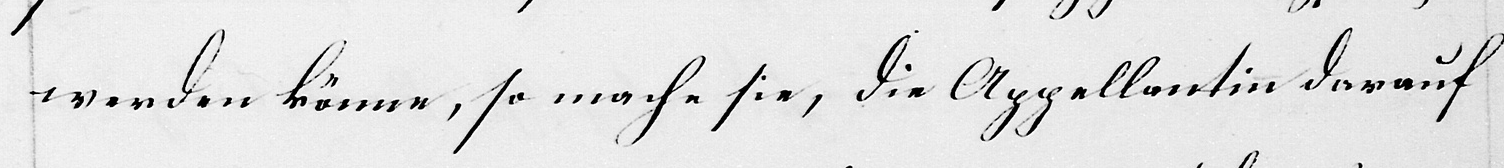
werden könne, so mache sie, die Appellantin darauf
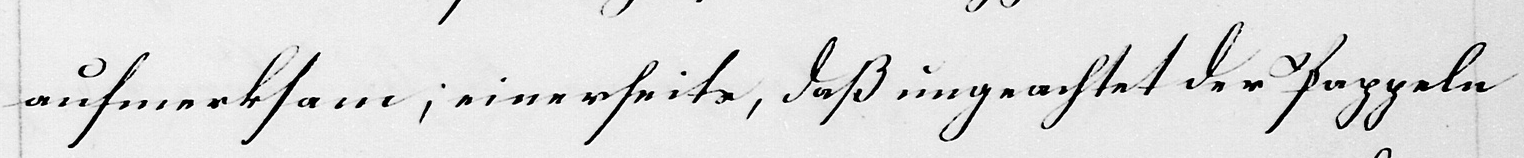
aufmerksam; einerseits, daß ungeachtet der Pappeln
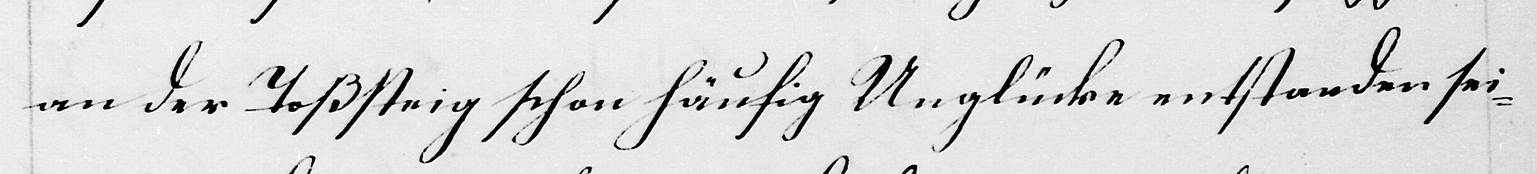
an der Toßsteig schon häufig Unglücke entstanden sei¬
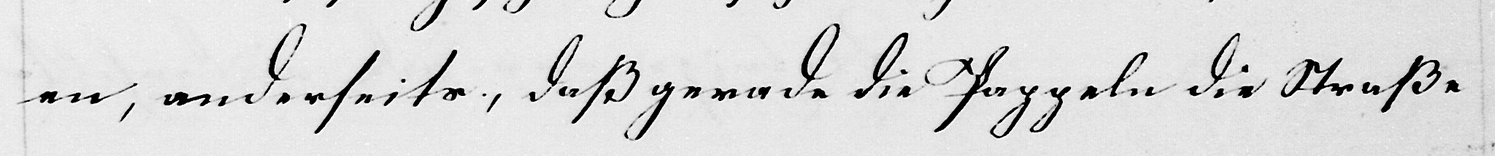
en, anderseits, daß gerade die Pappeln die Straße
